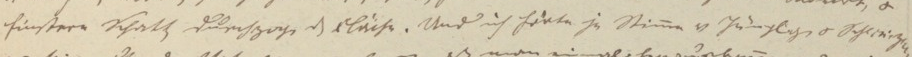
finstere Schatten durchzogen die Fläche. Und ich hörte j. Stimmen v Jünglingen & Schweizern,
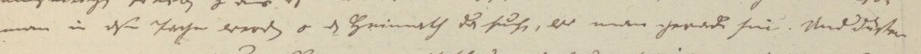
man in dsn Tagen werden & die Heimath da suchen, wo man gerade sei. Und düster
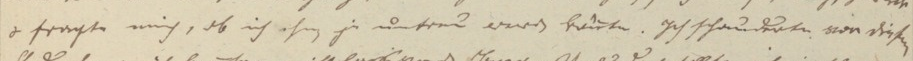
& fragte mich, ob ich ihnen je untreu werden könnte. Ich schauderte vor diesem
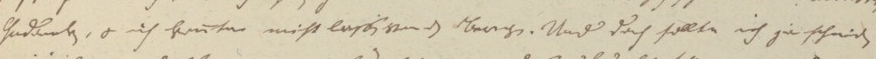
Gedanken, & ich konnte nicht lassen von den Bergen. Und doch sollte ich ja scheiden
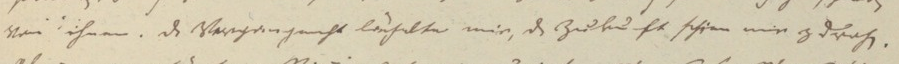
von ihnen. Die Vergangenheit lächelte mir, die Zukunft schien mir z drohen.
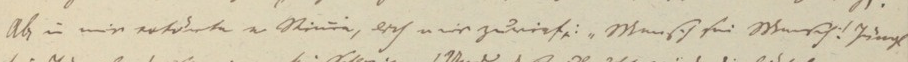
Aber in mir ertönte e. Stimme, wch mir zurief: «Mensch sei Mensch! Jüngl
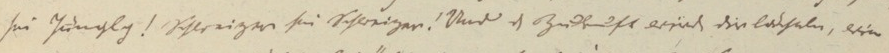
sei Jünglg! Schweizer sei Schweizer! Und die Zukunft wird dir lächeln, wie
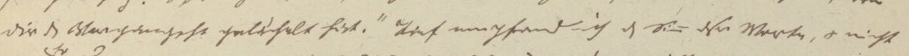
dir die Vergangenht gelächelt hat.» Tief empfand ich den Sinn dsr Worte, & nicht
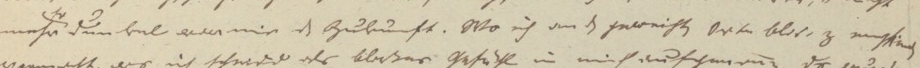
mehr so dunkel war mir die Zukunft. Ws ich an dem geweihten Orte blos z empfinden
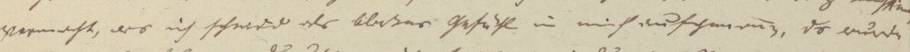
vermocht, ws ich scheidd als blaßes Gefühl in mich aufgenommen, ds wurde
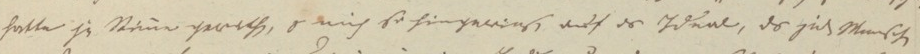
hatte jene Stimme gerathen, & mich so hingewiesen auf ds Ideal, ds jedem Menschen
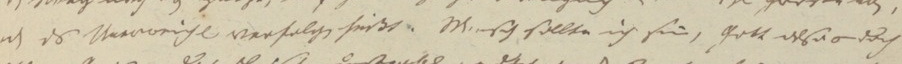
die ds Unerreichl. verfolgen heißt. Mensch sollte ich sein, Gott also & doch
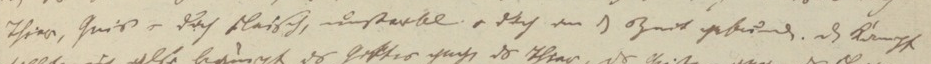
Thier, Geist & doch Fleisch, unsterblich & doch an die Zeit gebunden. Die Kämpfe
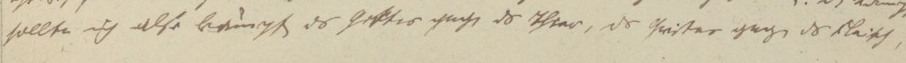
sollte ich also kämpfen ds Gottes gegen ds Thier, ds Geistes gegen ds Fleisch,
